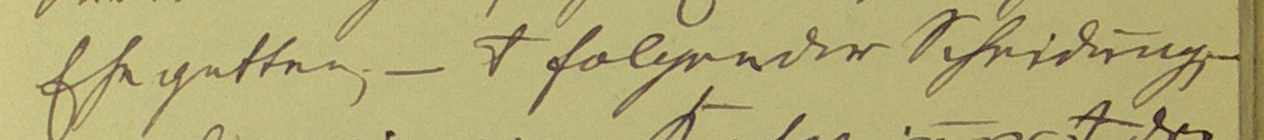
Ehegatten;- mit folgender Scheidung,
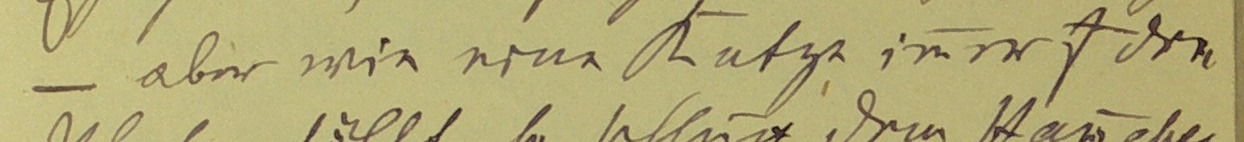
-aber wie eine Katze immer auf die
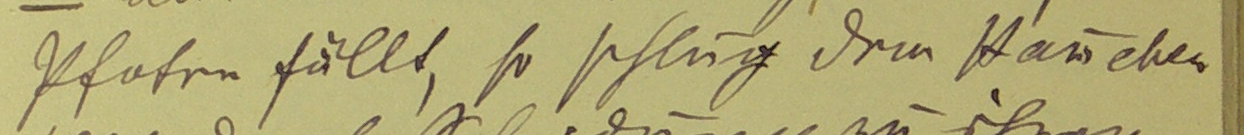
Pfoten fällt , so schlug dem Hännchen
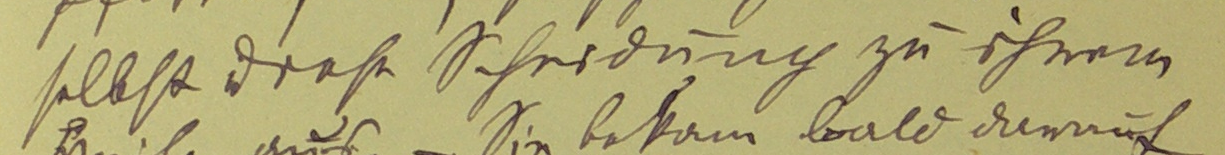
selbst diese Scheidung zu ihrem
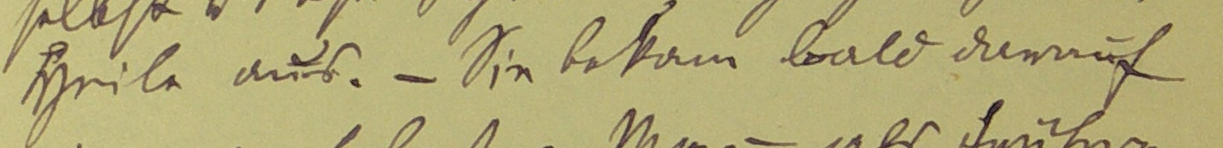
Heile aus.- Sie bekam bald darauf
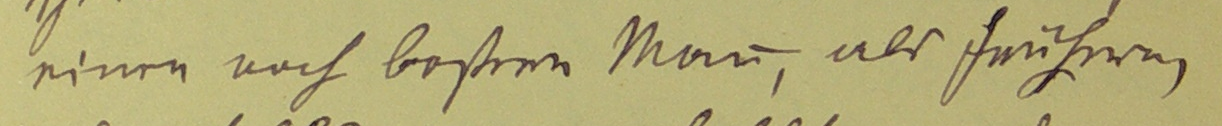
einen noch besseren Mann als früher,
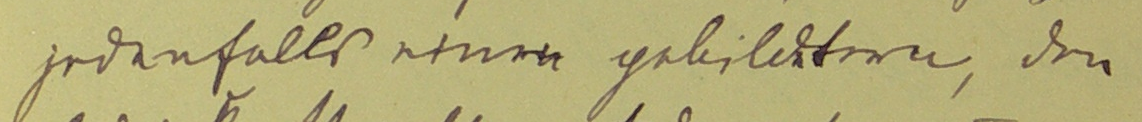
jedenfalls einen gebildeteren, den
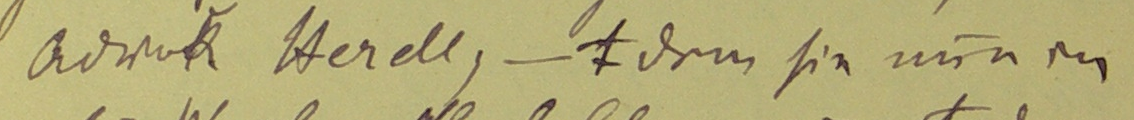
Adrock Herell ,-mit dem sie nun in
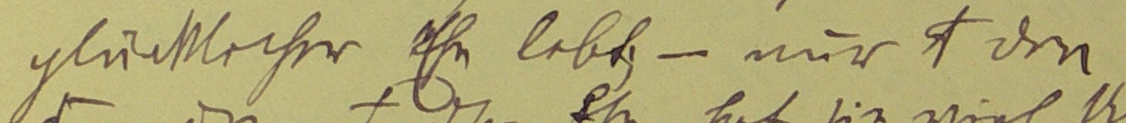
glücklicher Ehe lebt,- nur mit den
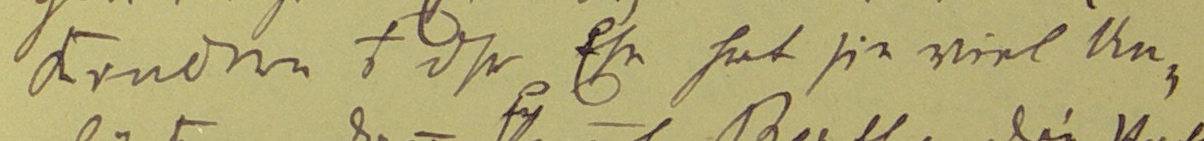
Kindern aus dieser Ehe hat sie viel Un¬
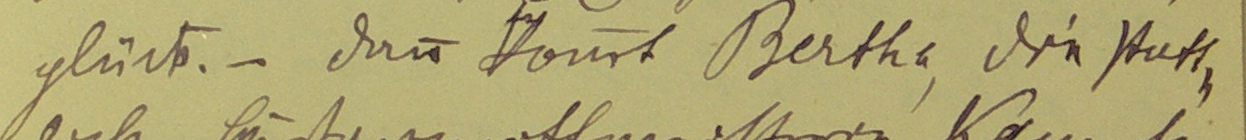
glück.- Dann kommt Bertha die statt¬
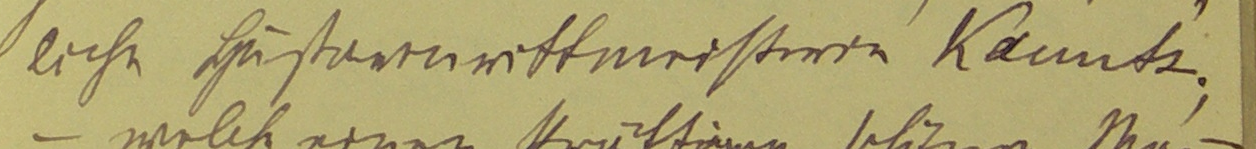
liche Hauptamtrittmeisterin Kauntz;
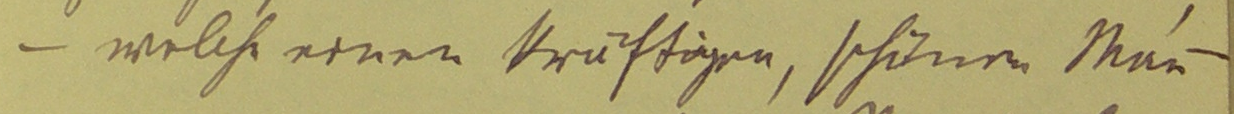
- welche einen kräftigen, schönen Mann¬
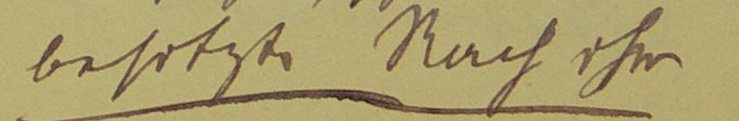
besitzte. Nach ihr
